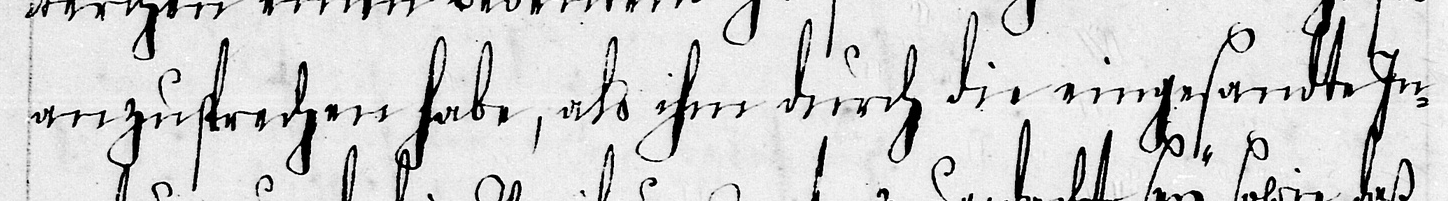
anzusprechen habe, als ihm durch die eingesandte In¬
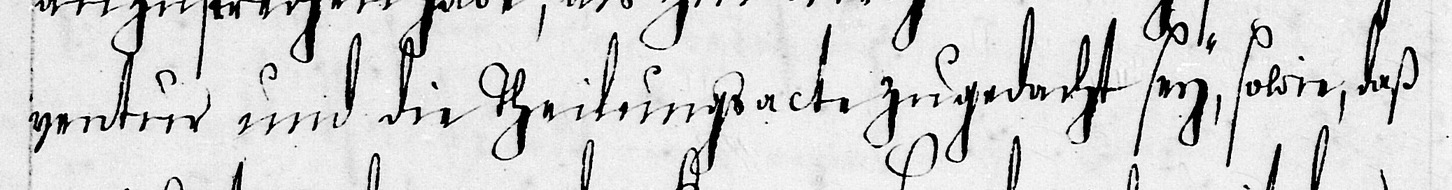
ventur und die Theilungsacte zugedacht sey, sowie, daß
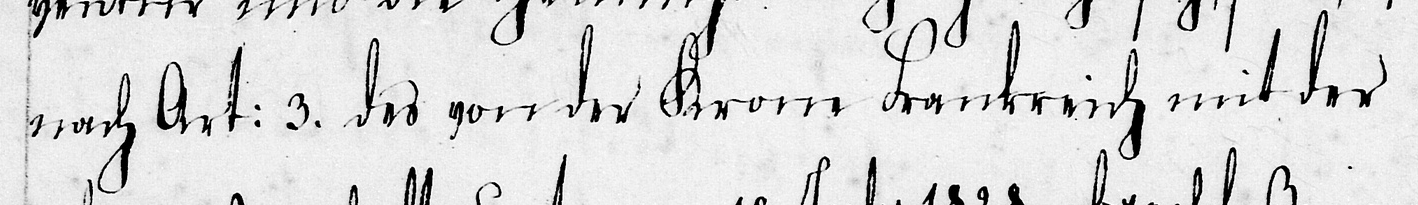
nach Art: 3. des von der Krone Frankreich mit der
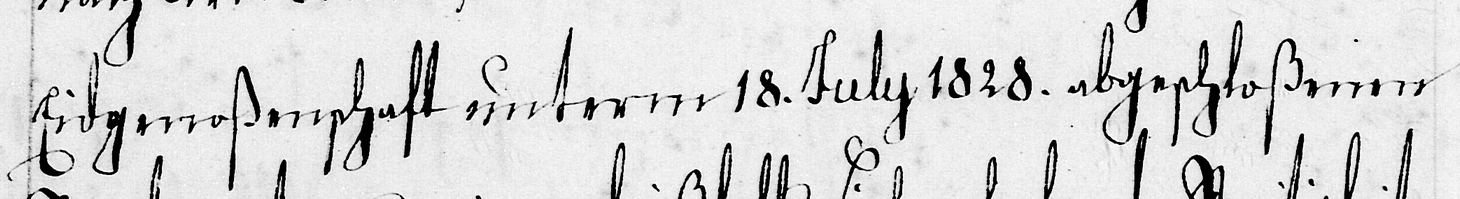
Eidgenoßenschaft unterm 18. July 1828. abgeschloßenen
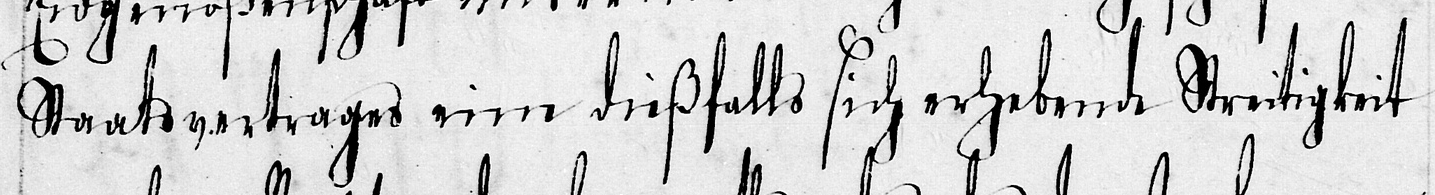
Staatsvertrages eine dießfalls sich erhebende Streitigkeit
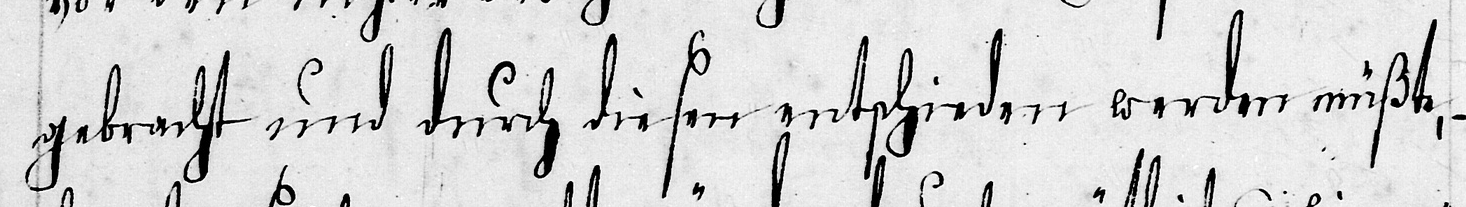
gebracht und durch diesen entschieden werden müßte,
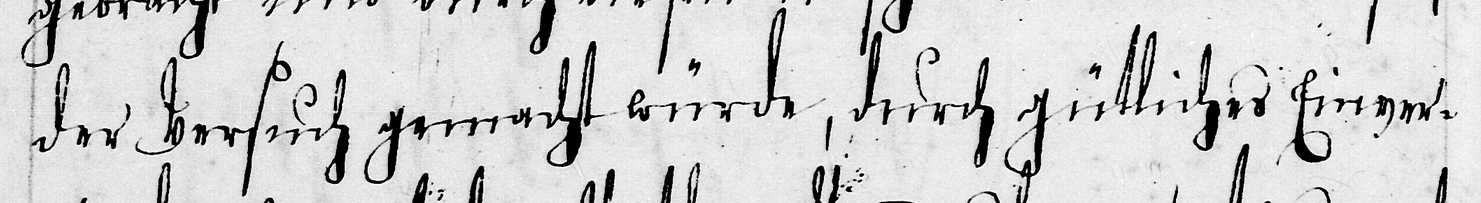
der Versuch gemacht würde, durch gütliches Einver¬
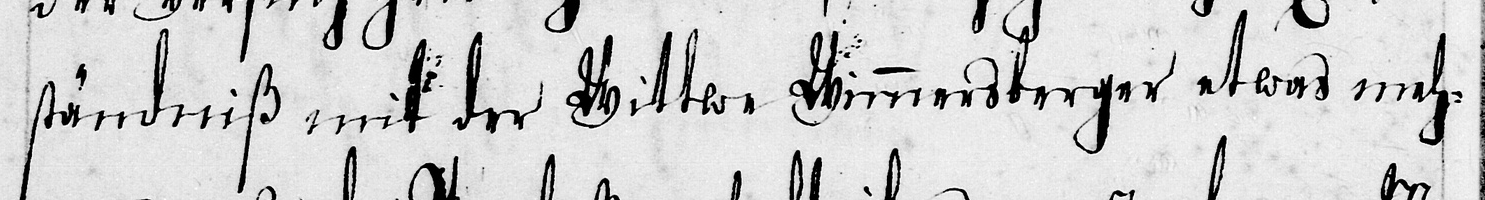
ständniß mit der Wittwe Wimmersberger etwas meh¬
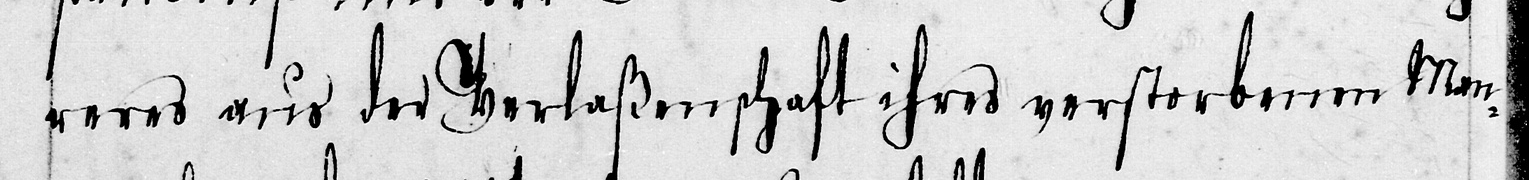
reres aus der Verlaßenschaft ihres verstorbenen Man¬
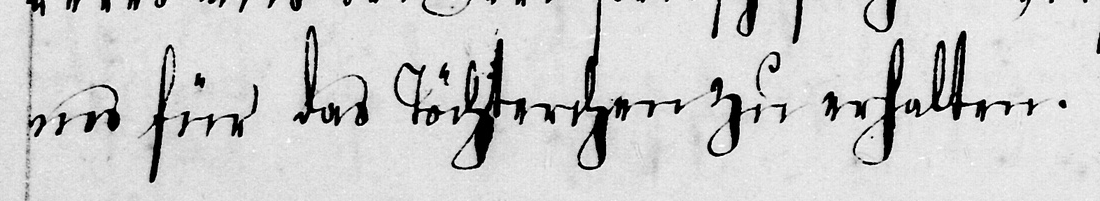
nes für das Töchterchen zu erhalten.
